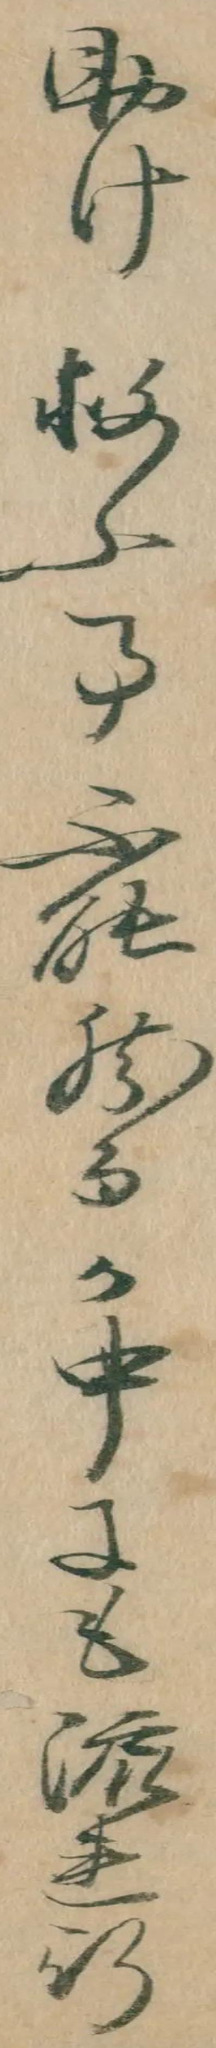助け救ふ事不能然るか中にも流れ行
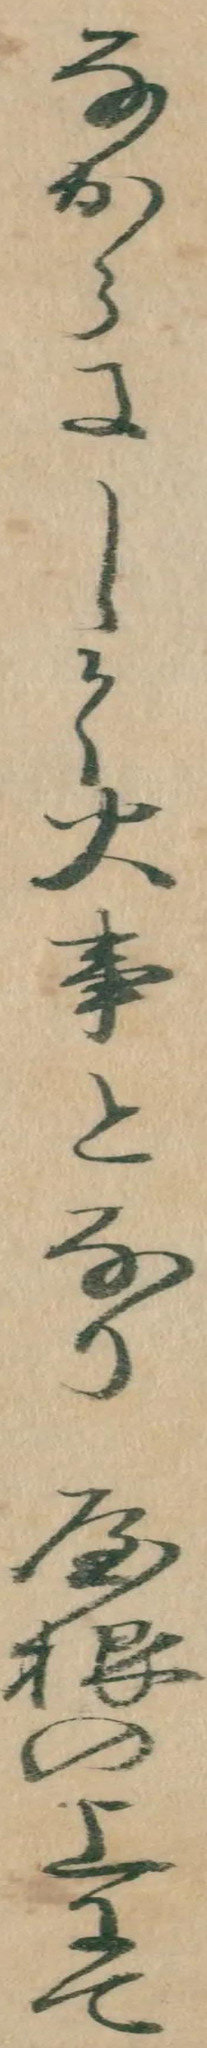なからにして火事となり屋根の上にて
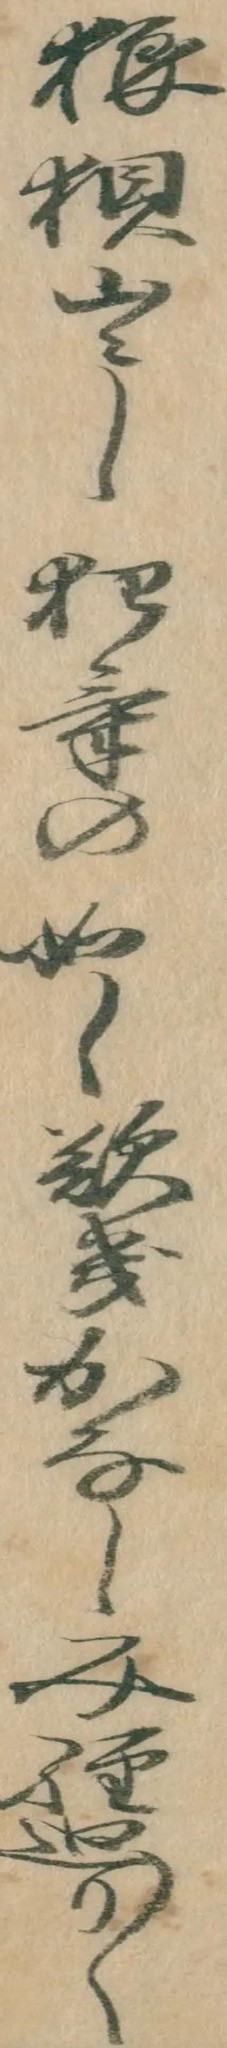狼狽出し狂気の如し歎きかなしみ経廻り〳〵
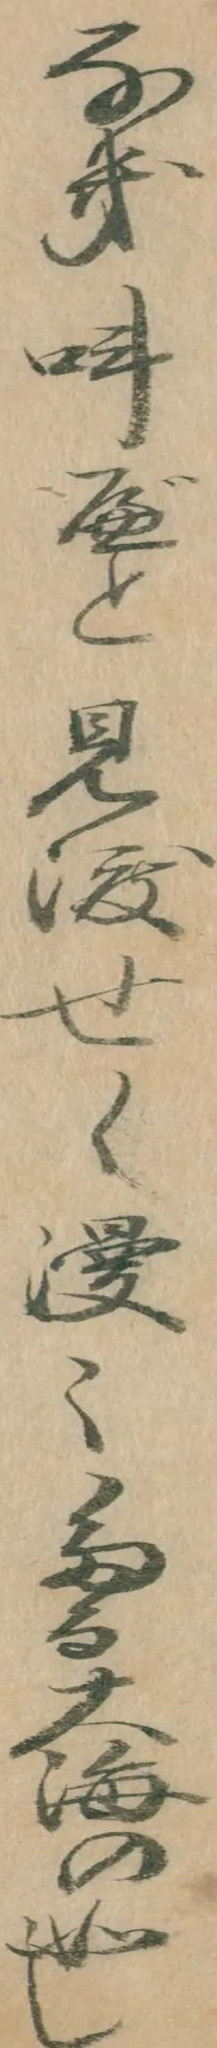なき叫べと見渡せし漫々たる大海の如し
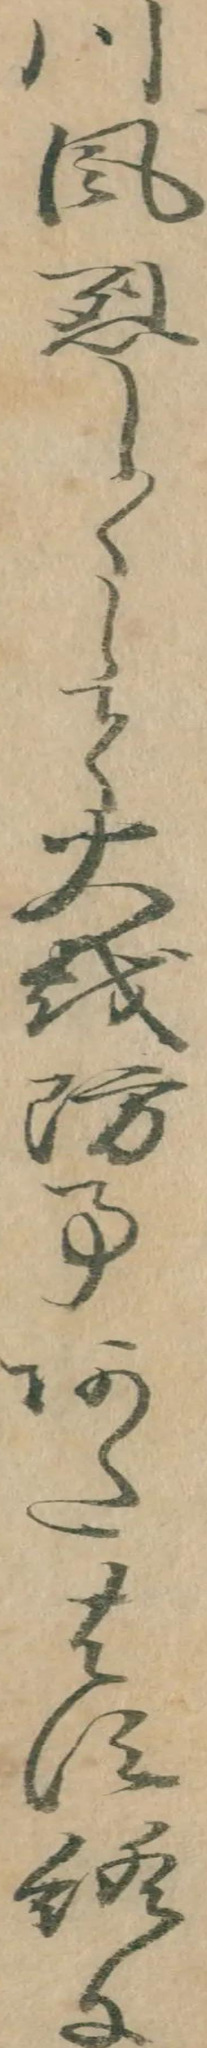川風烈しくして火を防事あたはす終に

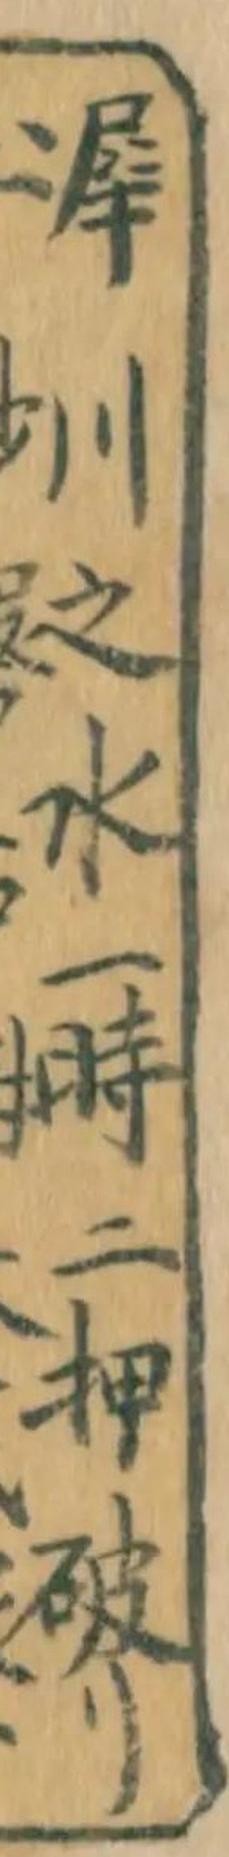犀川之水一時ニ押破リ

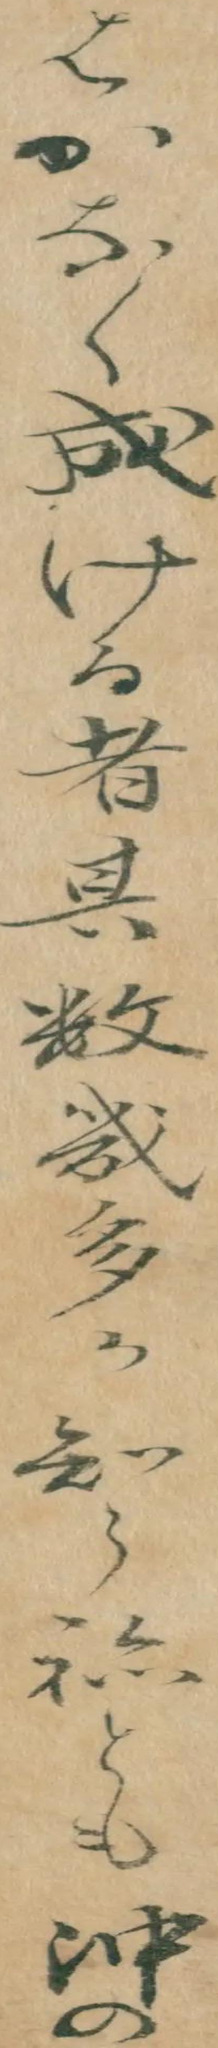はかなく成ける者其数幾多か知らねとも沖の
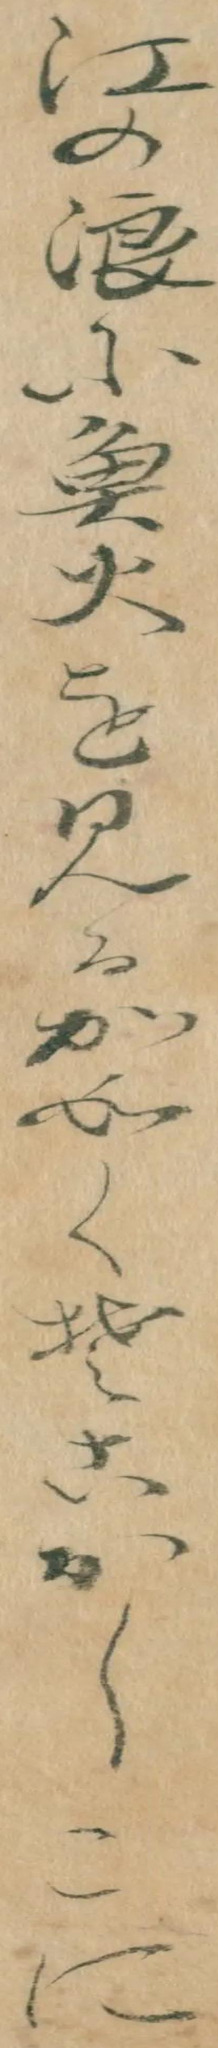江の浪に魚火を見るか如くそこかしこに
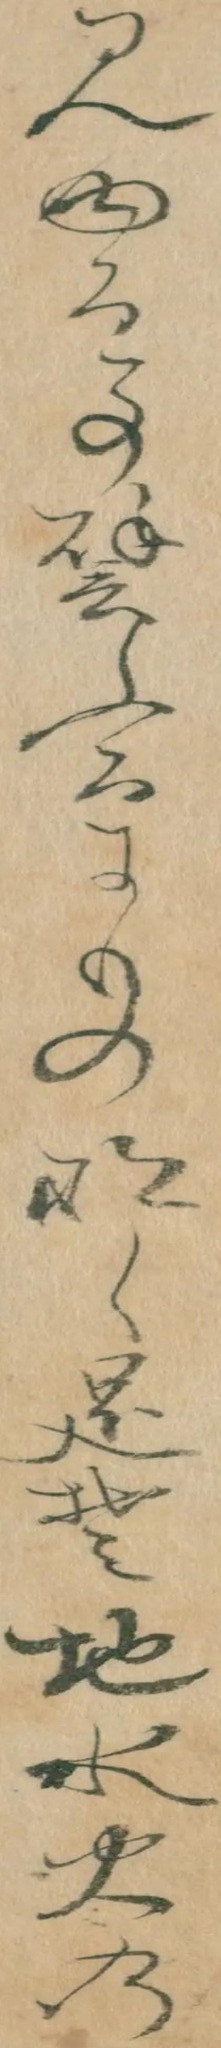見ゆる事譬ふるにものなく是そ地水火の
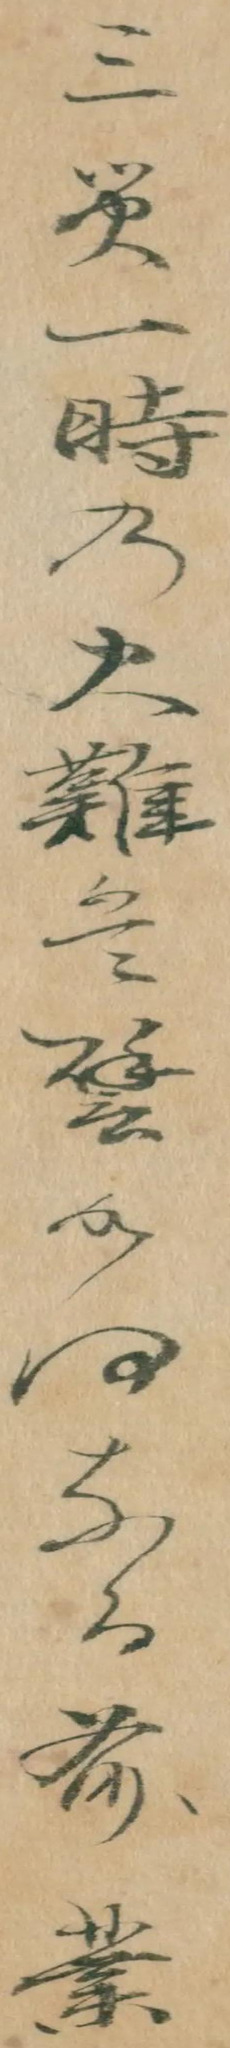三災一時の火難は譬如何なる前業
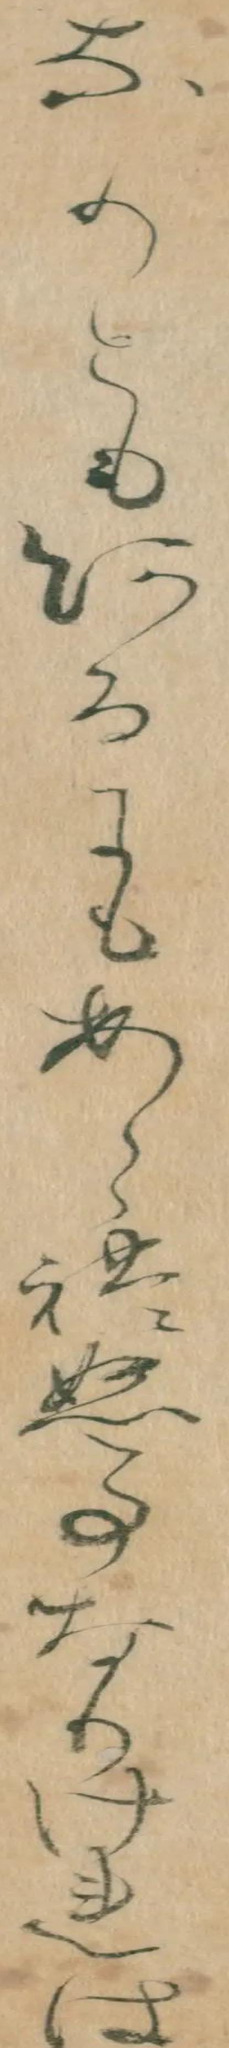なりともあるにもあられぬ事なりけれは
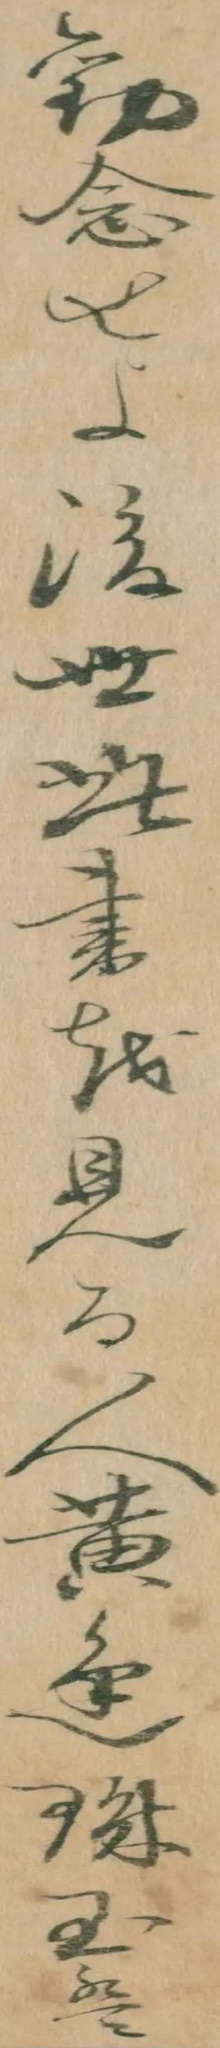勧念せよ後世此書を見る人黄金珠玉は
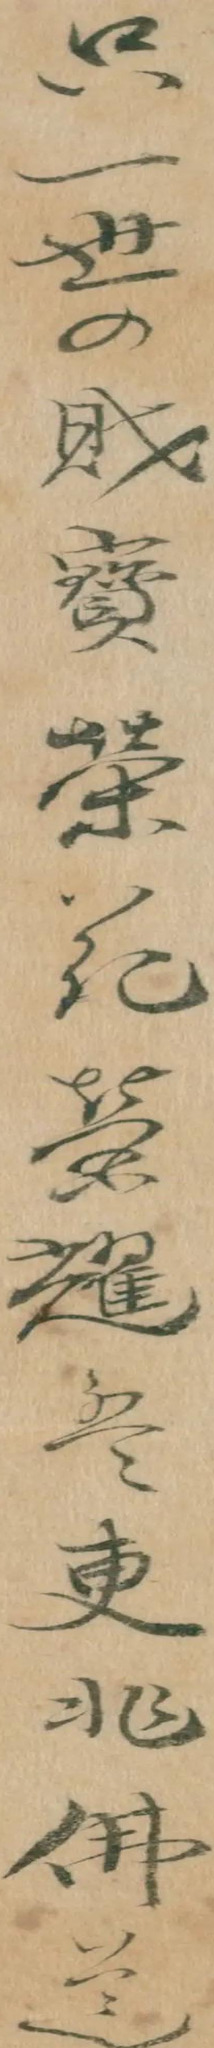只一世の財宝栄花栄耀は更非仏道
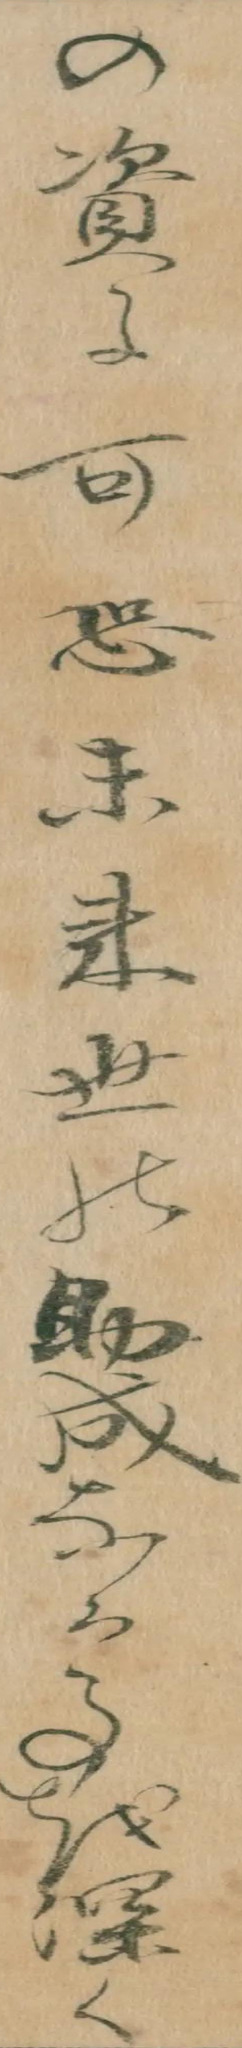の資に可恐未来世の助成なる事を深く
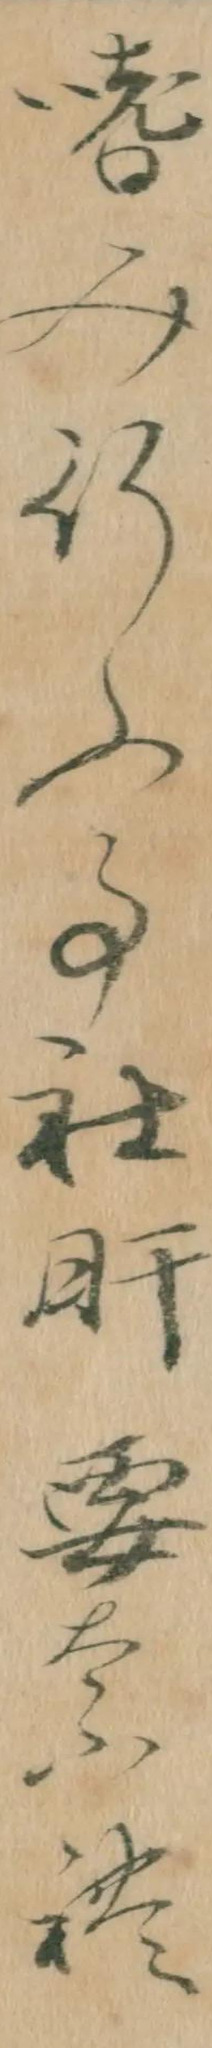嗜み行ふ事社肝要なれ
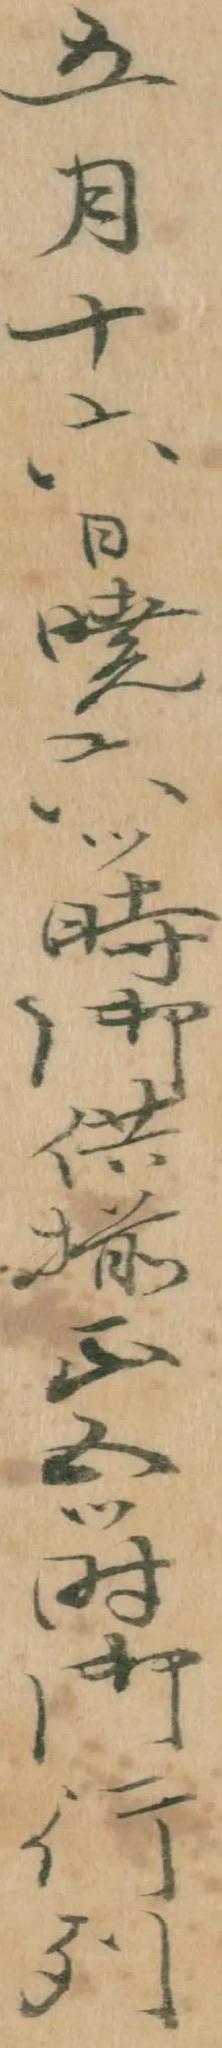五月十六日暁六ツ時御供揃ふ五ツ時御行列
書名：俗語之種. [7]
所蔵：国立国会図書館 National Diet Library, JAPAN
